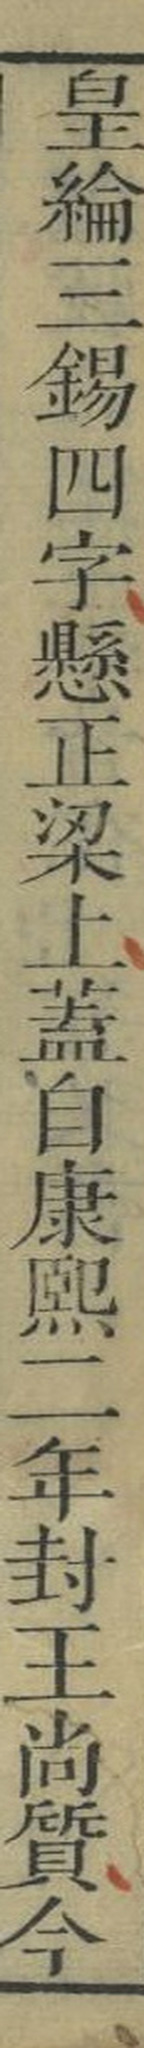皇綸三錫四字懸正梁上蓋自康煕二年封王尚質今
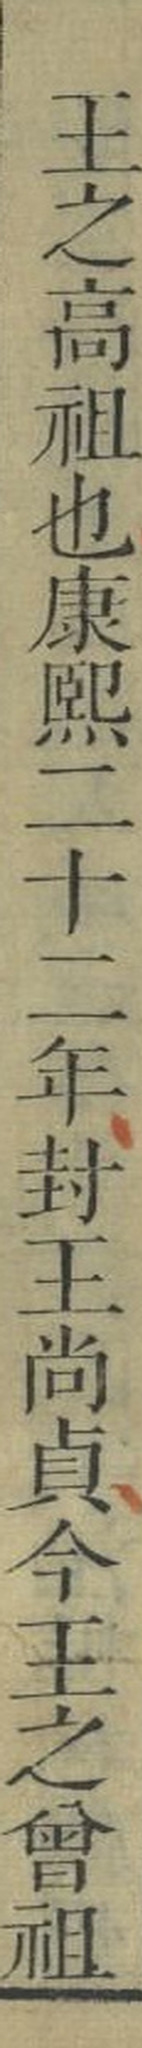王之高祖也康煕二十二年封王尚貞今王之曾祖
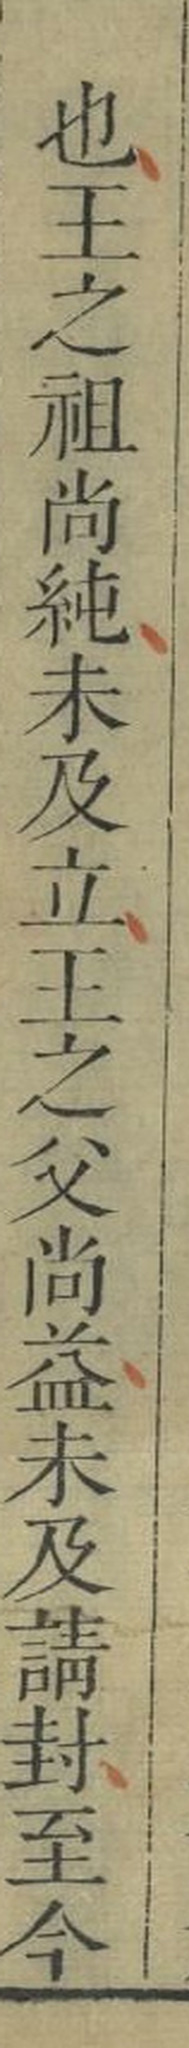也王之祖尚純未及立王之父尚益未及請封至今
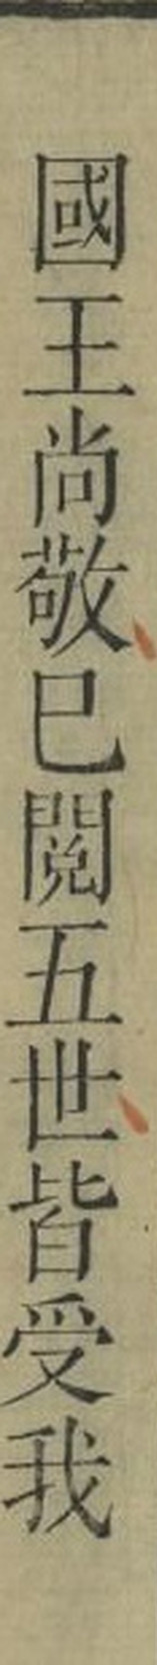國王尚敬巳閲五世皆受我
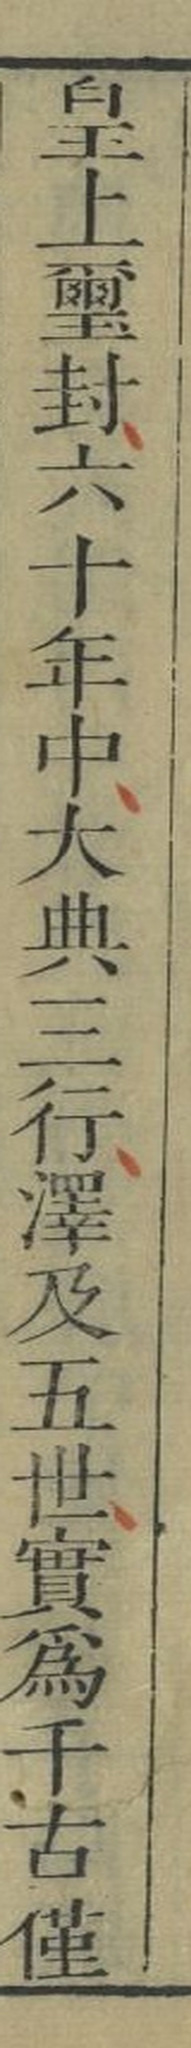皇上璽封六十年中大典三行澤及五世實爲千古僅
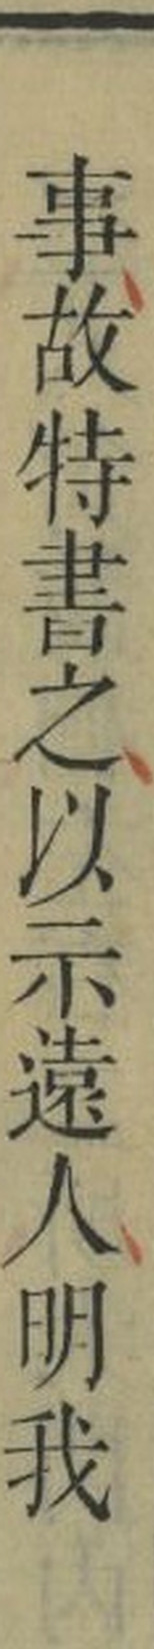事故特書之以示遠人明我
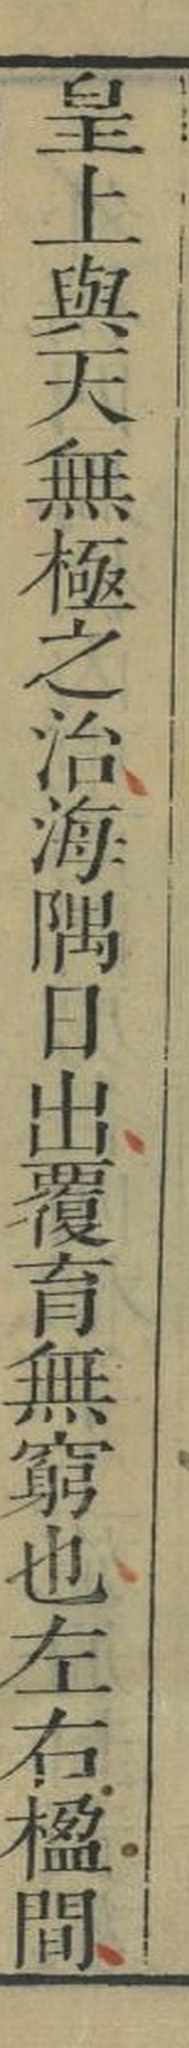皇上與天無極之治海隅日出覆育無窮也左右楹間
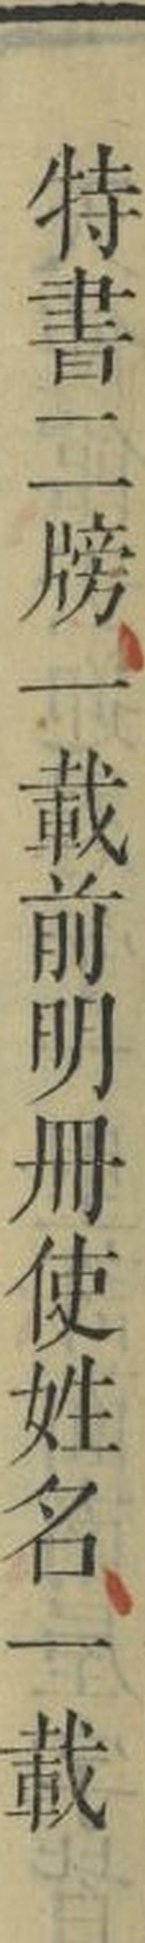特書二牓一載前明冊使姓名一載
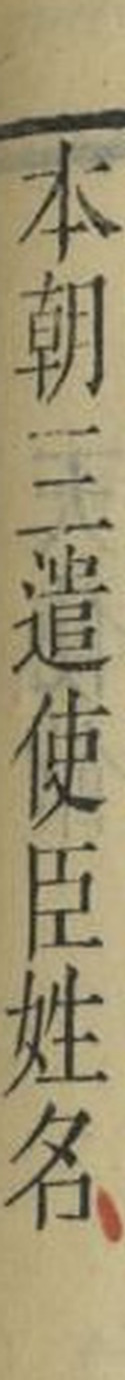本朝三遣使臣姓名
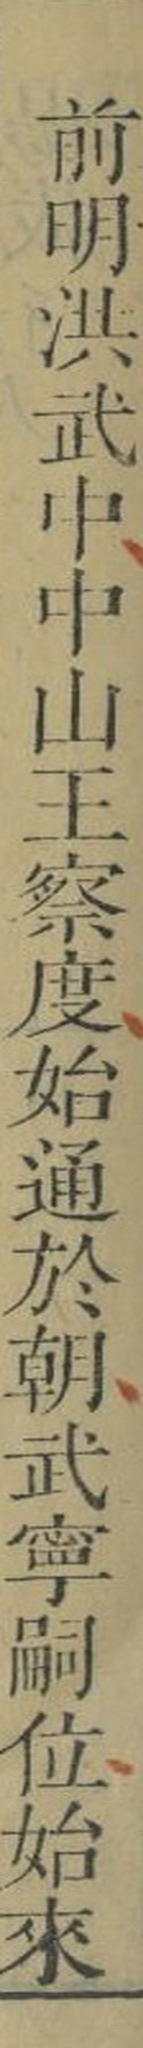前明洪武中中山王察度始通於朝武寧嗣位始來
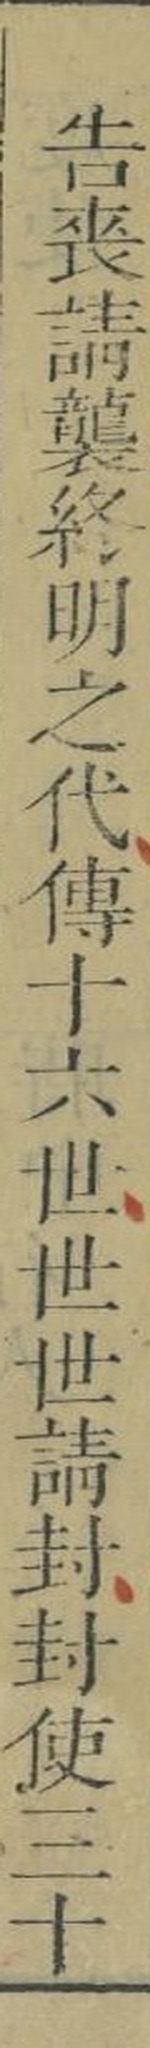告䘮請襲終明之代傳十六世世世請封封使三十
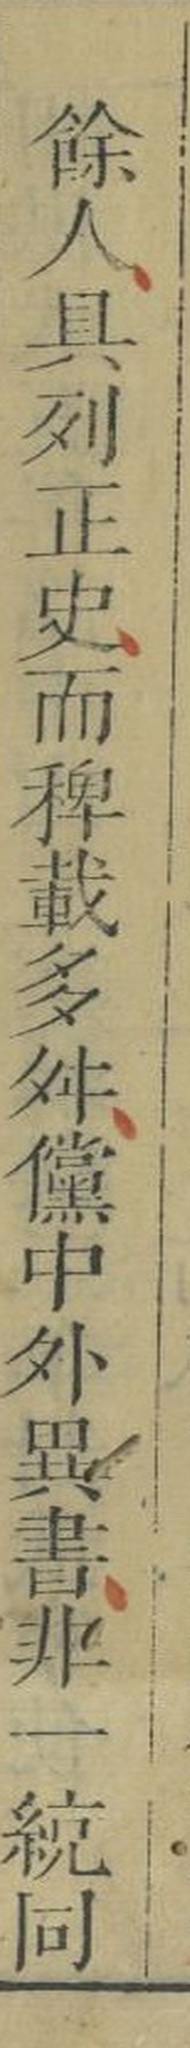餘人具列正史而稗載多舛儻中外異書非一綂同
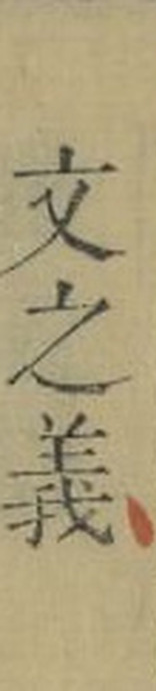文之義
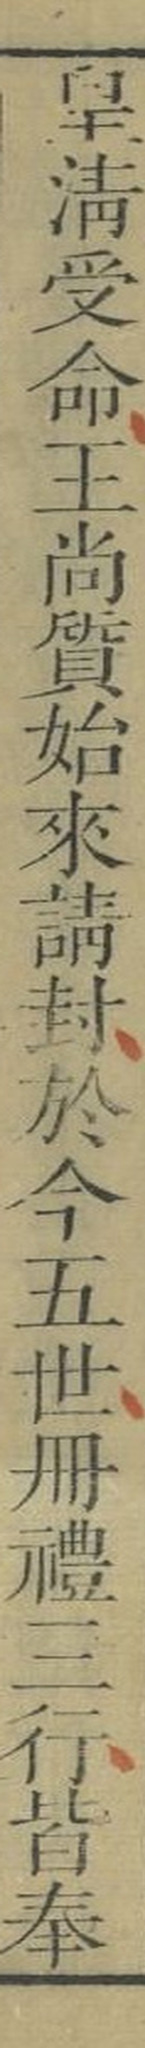皇淸受命王尚質始來請封於今五世冊禮三行皆奉
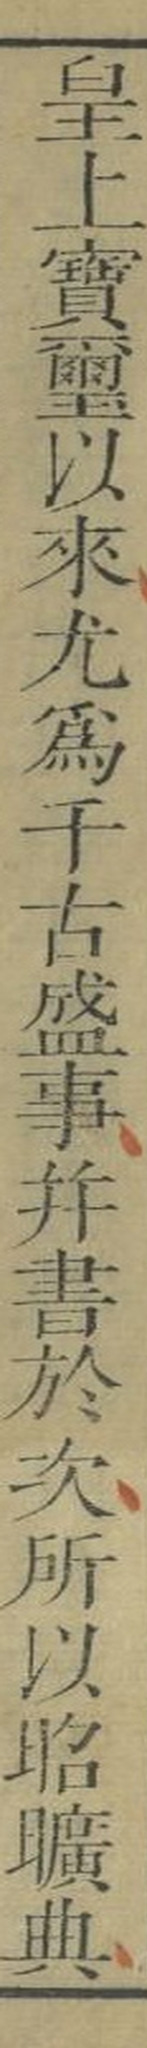皇上寶璽以來尤爲千古盛事幷書於次所以眧矌典
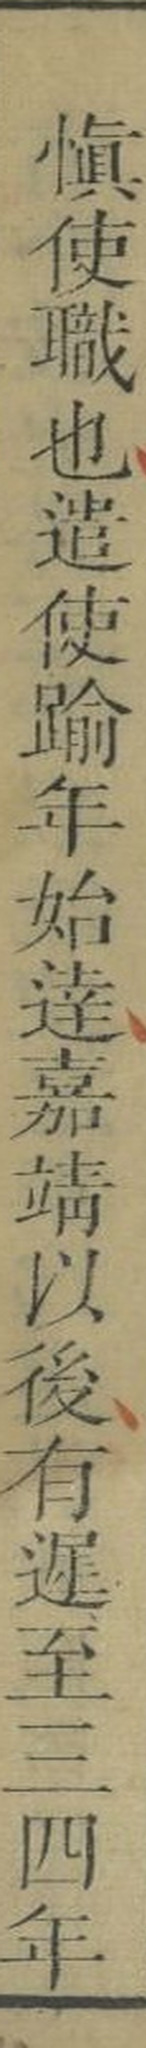愼使職也遣使踰年始逹嘉靖以後有遲至三四年
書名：中山伝信録 巻一、巻二
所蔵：University of the Ryukyus Library
